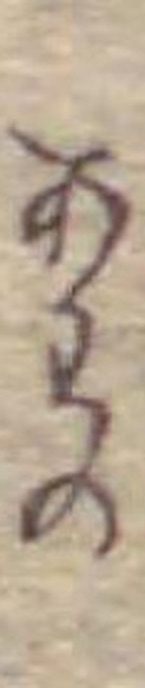あわの
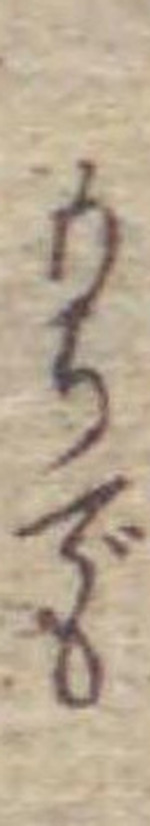もちでも
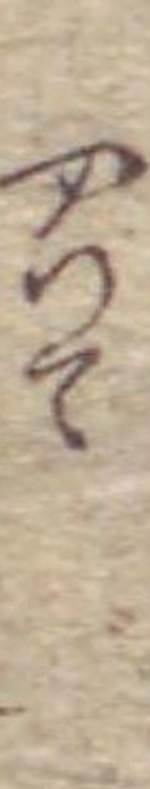やいて
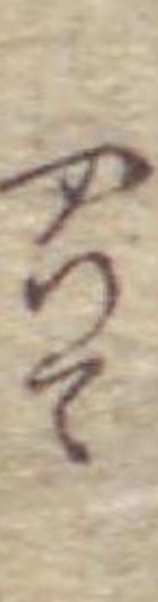やいて
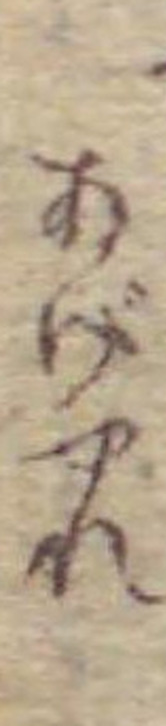あげやれ

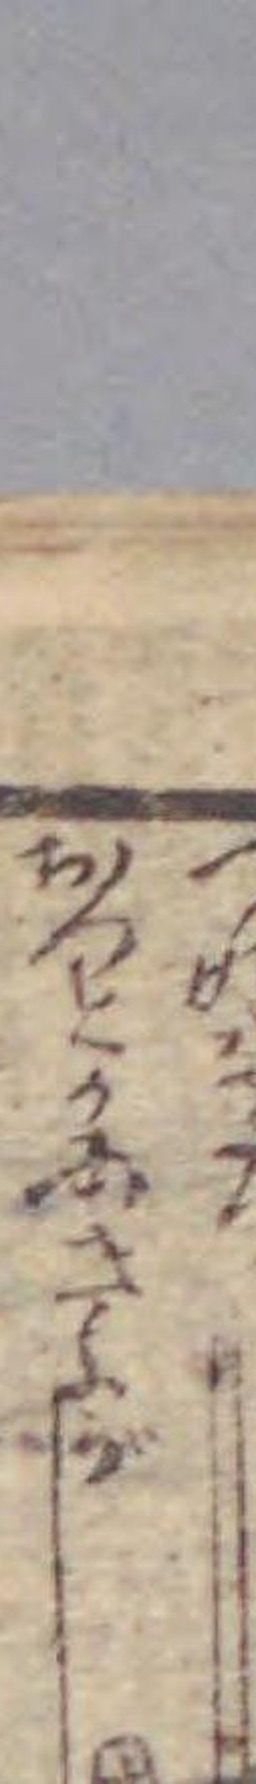おつとかにきよが
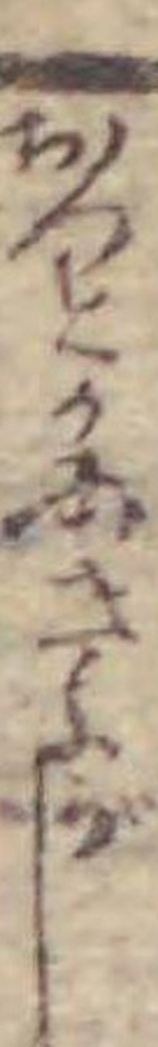おつとかにきよが
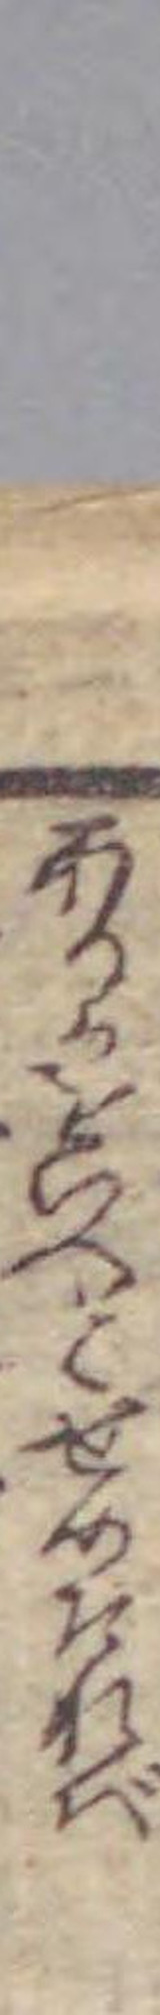ありかをいへとせめたれば
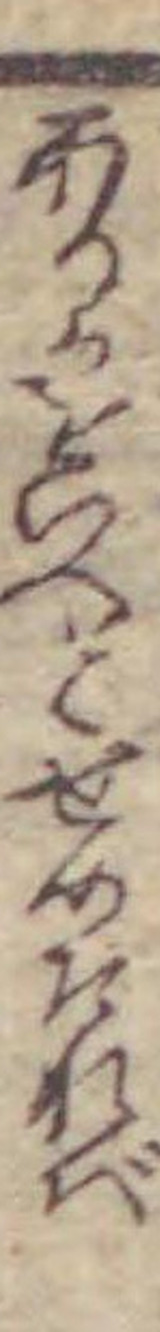ありかをいへとせめたれば
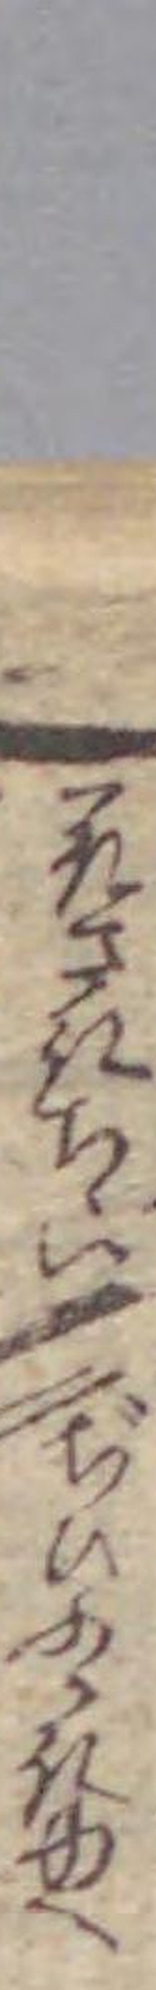花さきちゝいぢひふかきゆへあ
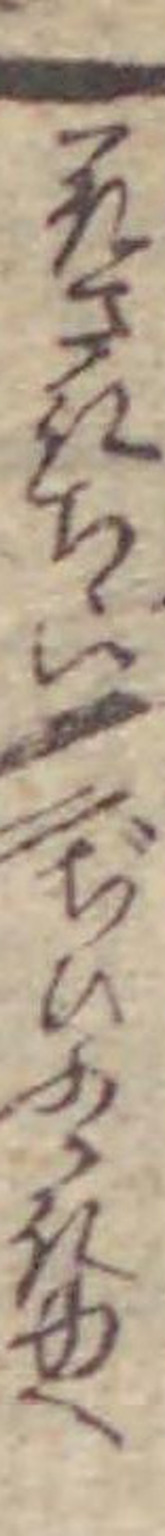花さきちゝいぢひふかきゆへあ
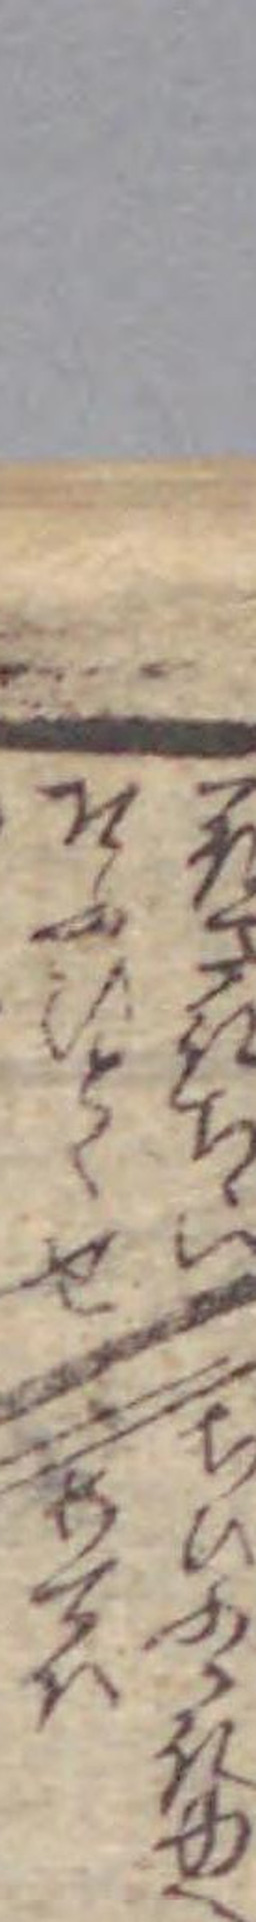のふひとくせめてはらふ
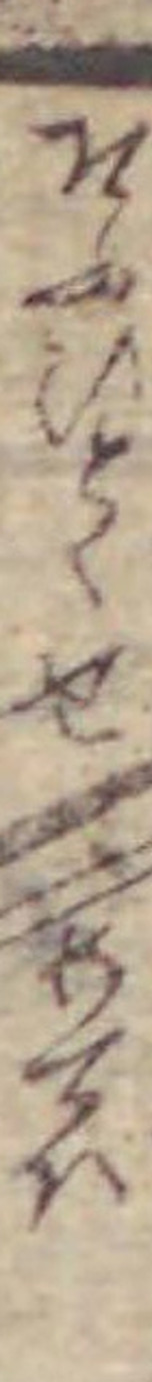のふひとくせめてはらふ
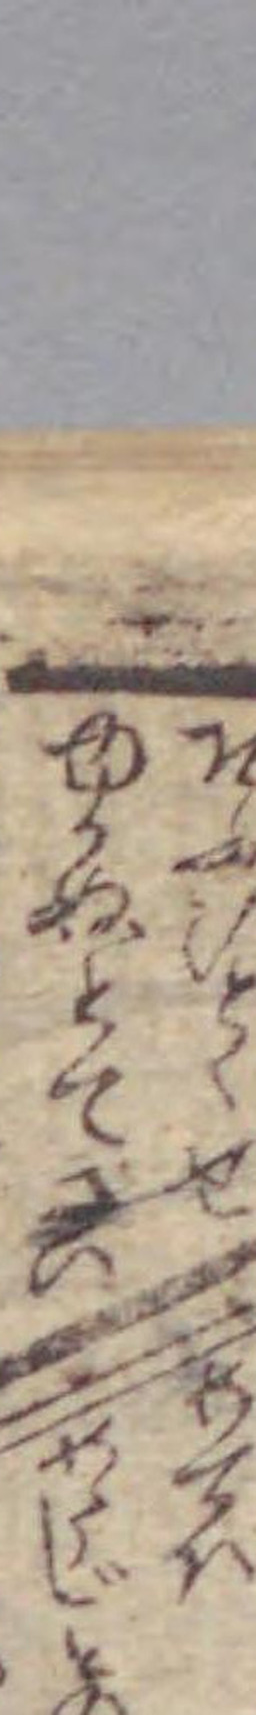やらぬとてさいめうじとの
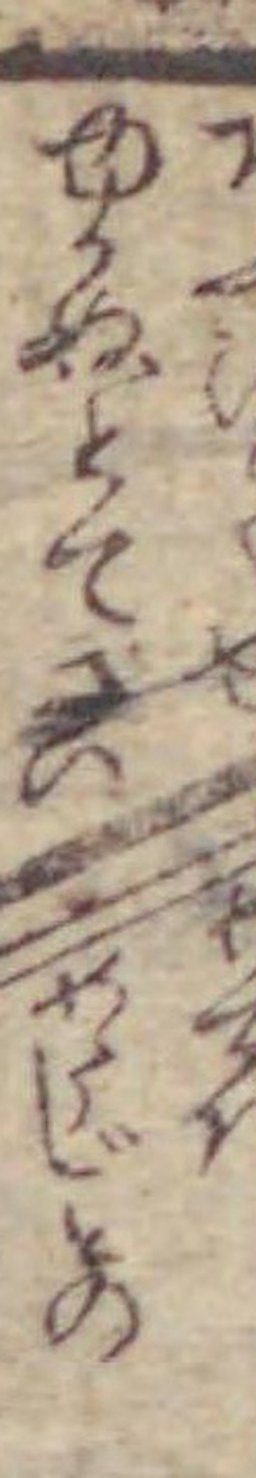やらぬとてさいめうじとの
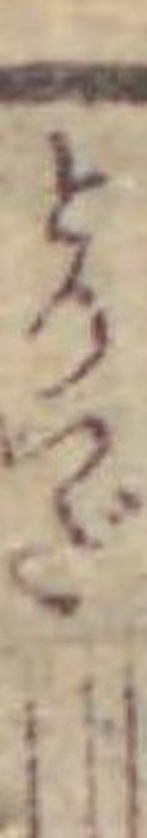とりいだ
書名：交古勢昔咄 : 2巻
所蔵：国立国会図書館 National Diet Library, JAPAN
